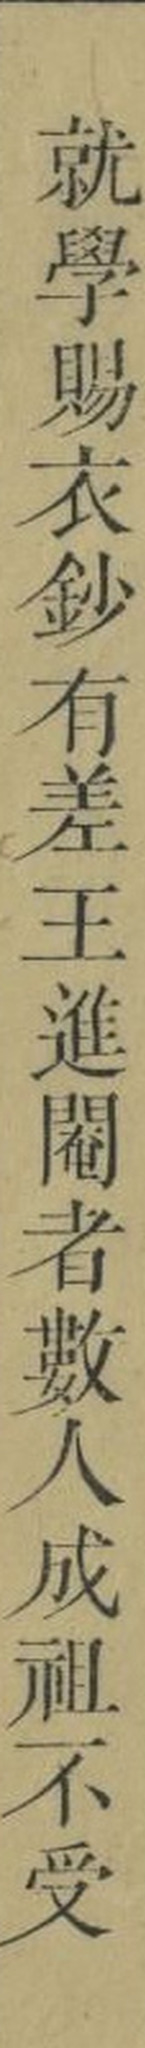就学賜衣鈔有差王進閹者数人成祖不受
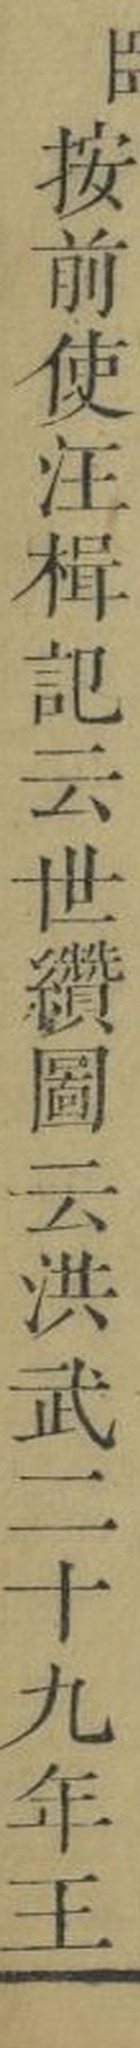臣按前使汪楫記云世纘図云洪武二十九年王

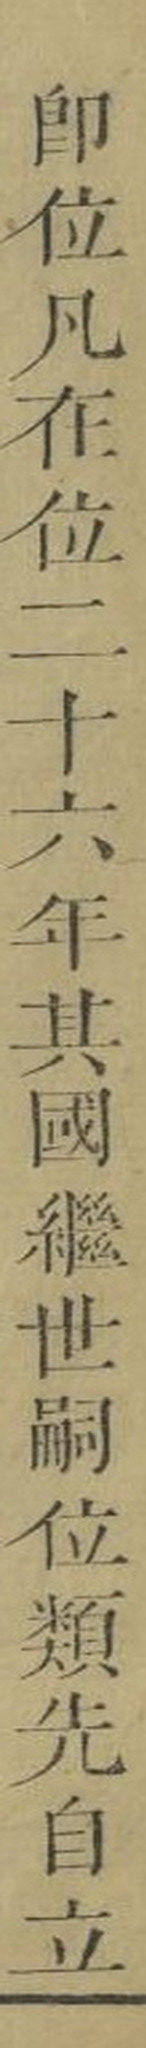即位凡在位二十六年其国継世嗣位類先自立
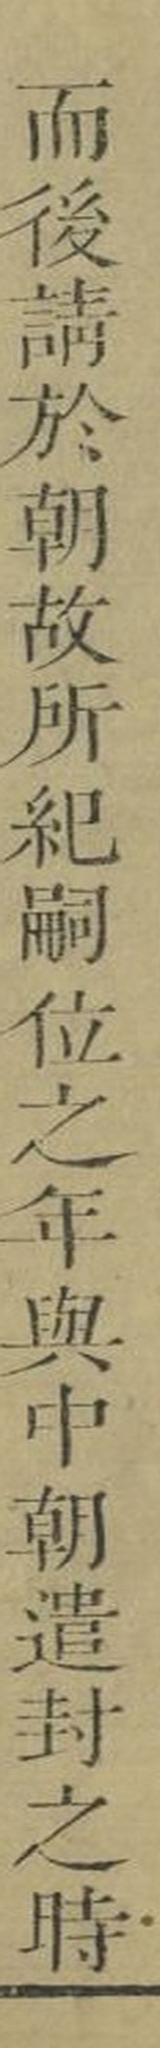而後請於朝故所紀嗣位之年与中朝遣封之時
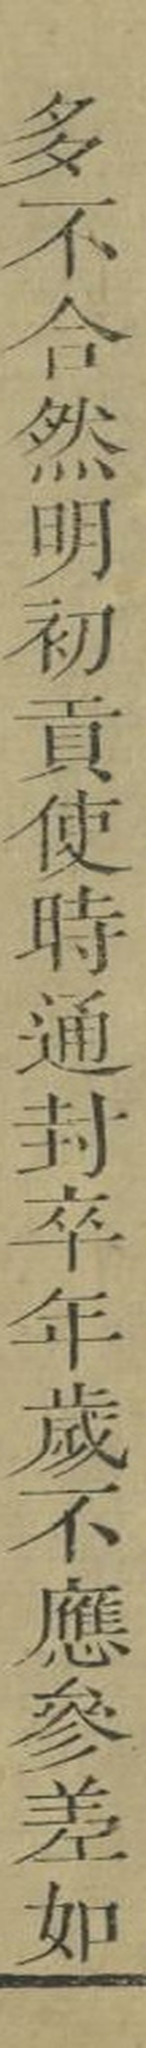多不合然明初貢使時通封卒年歳不応参差如
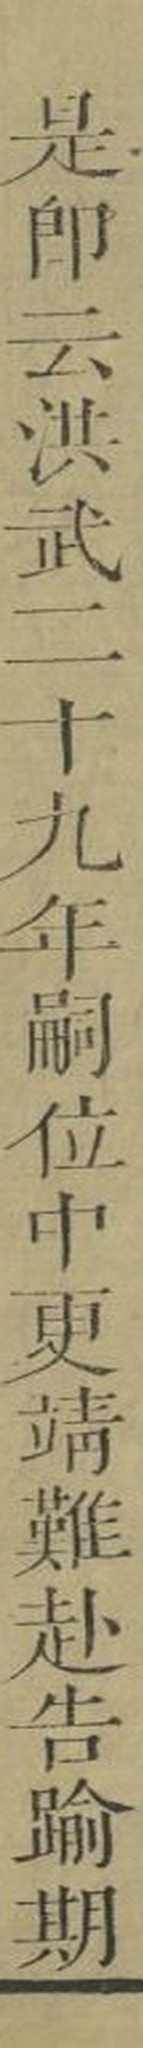是即云洪武二十九年嗣位中更靖難赴告踰期
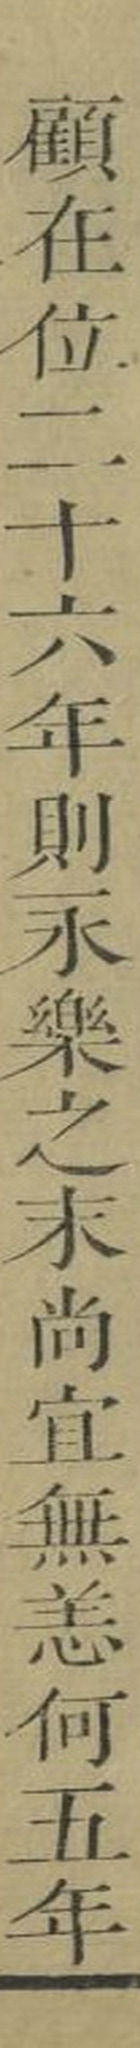顧在位二十六年則永楽之末尚宜無恙何五年
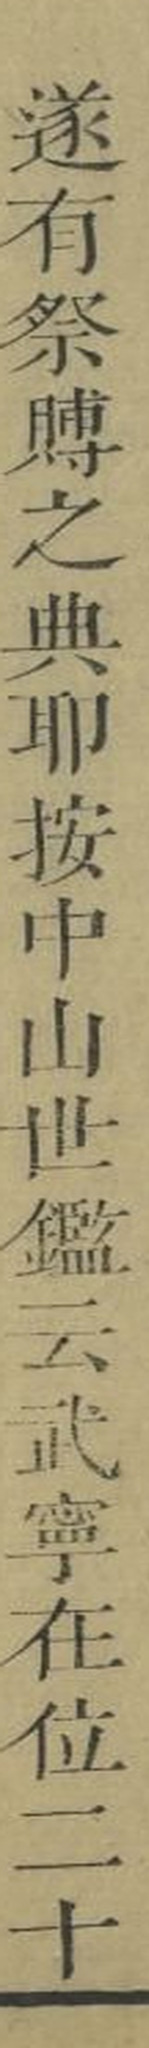遂有祭賻之典耶按中山世鑑云武寧在位二十
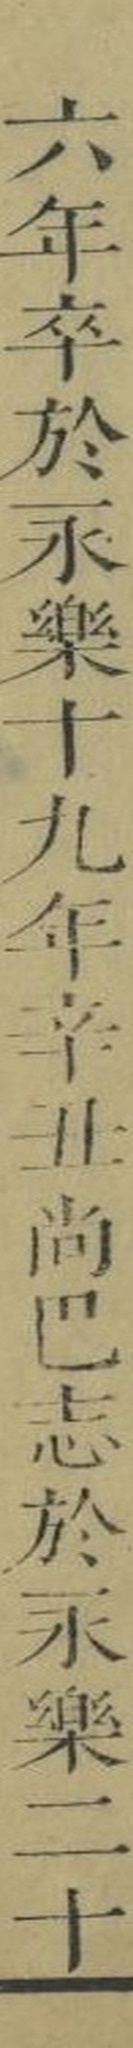六年卒於永楽十九年辛丑尚巴志於永楽二十
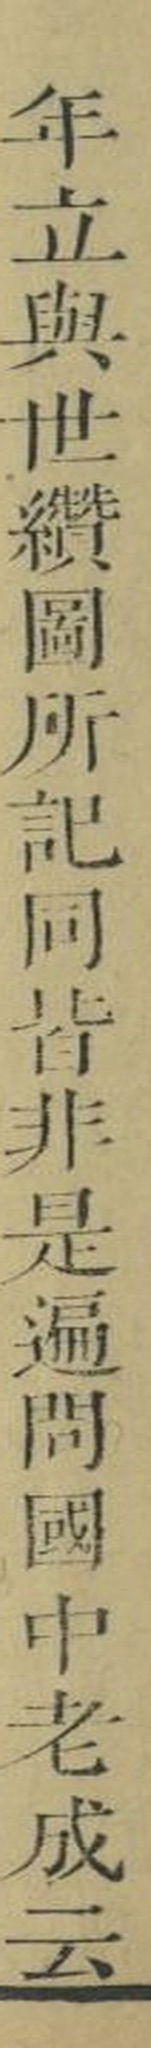年立与世纘図所記同皆非是遍問国中老成云
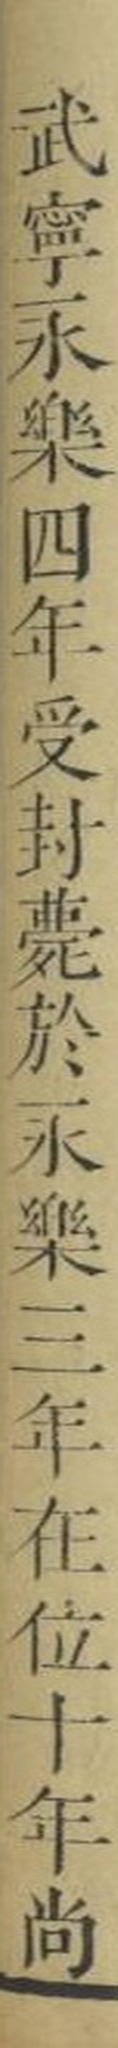武寧永楽四年受封薨於永楽三年在位十年尚
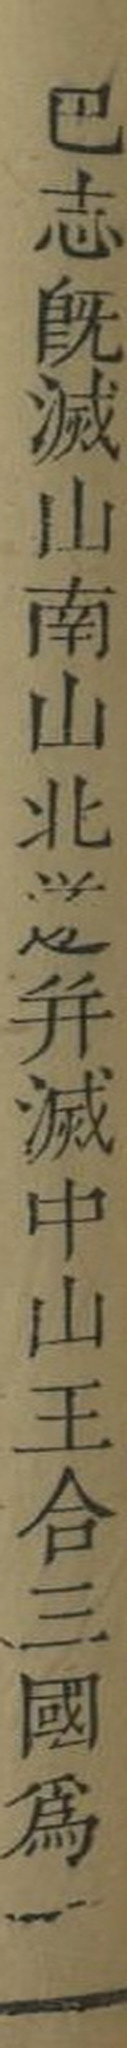巴志既滅山南山北遂并滅中山王合三国為一
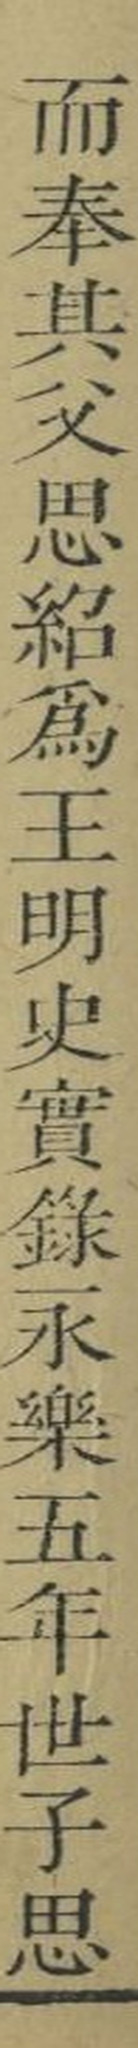而奉其父思紹為王明史実録永楽五年世子思
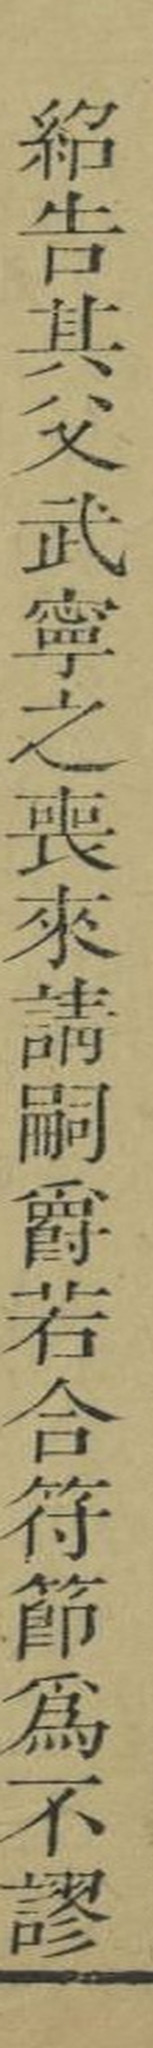紹告其父武寧之喪来請嗣爵若合符節為不謬
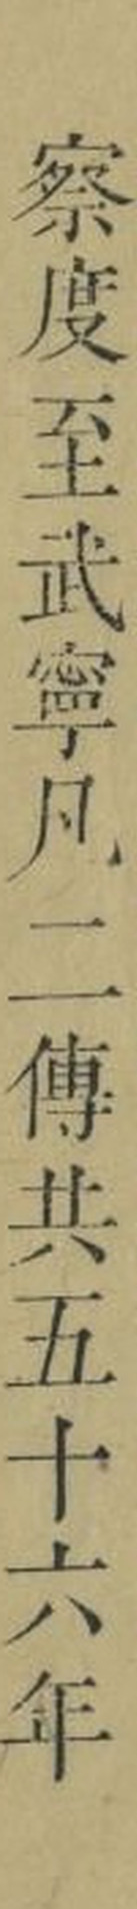察度至武寧凡二伝共五十六年
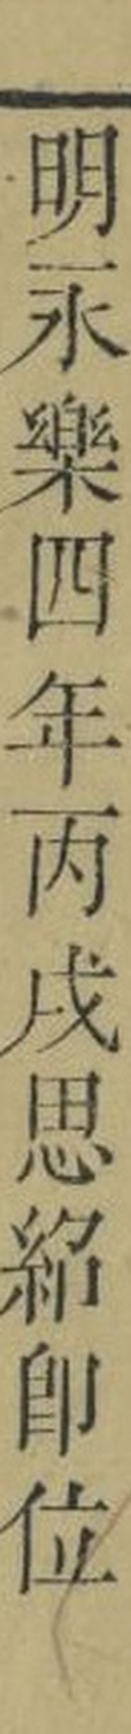明永楽四年丙戌思紹即位
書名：中山伝信録 巻三
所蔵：University of the Ryukyus Library
